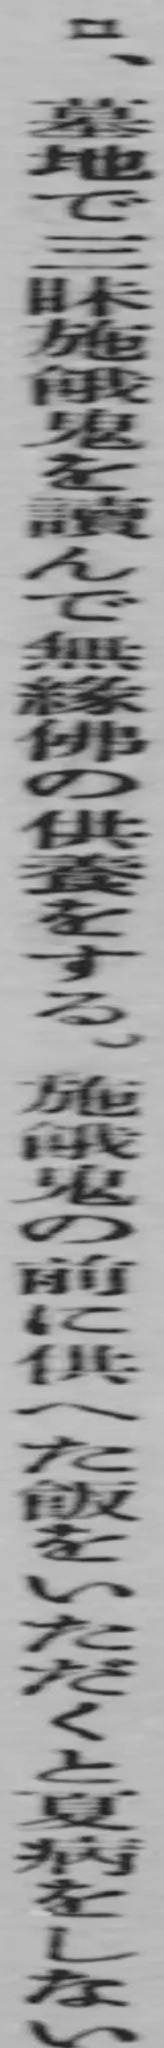ロ、墓地で三昧施餓鬼を讀んで無緣仏の供養をする。施餓鬼の前に供へた飯をいただくと夏病をしない

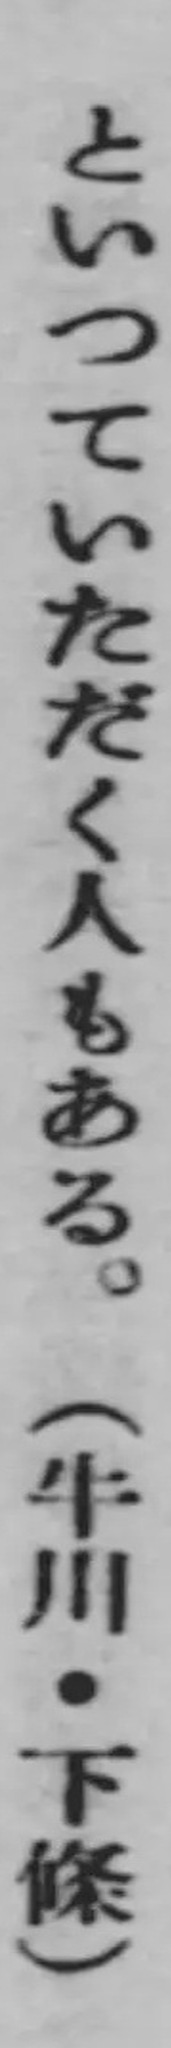といつていただく人もある。(牛川・下條)
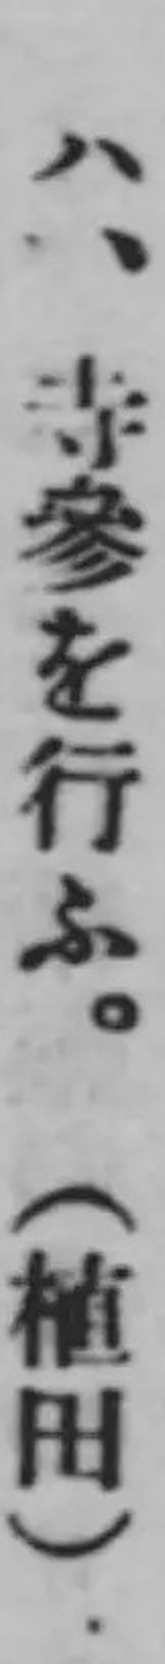ハ、寺參を行ふ。(植田)
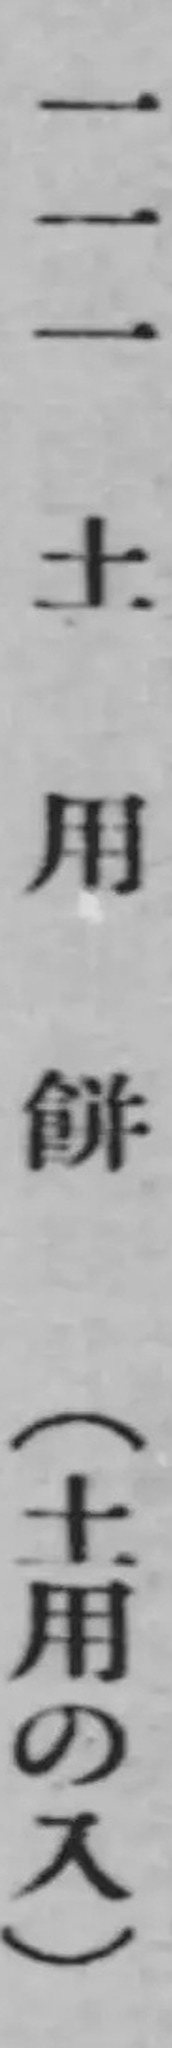一一一土用餅(土用の入)
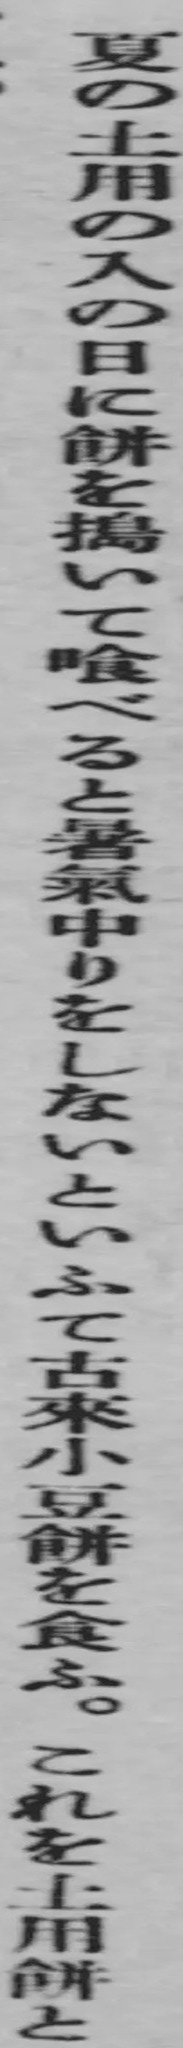夏の土用の入の日に餅を搗いて喰べると暑氣中りをしないといふて古來小豆餅を食ふ。これを土用餅と
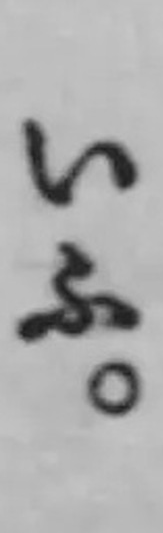いふ。
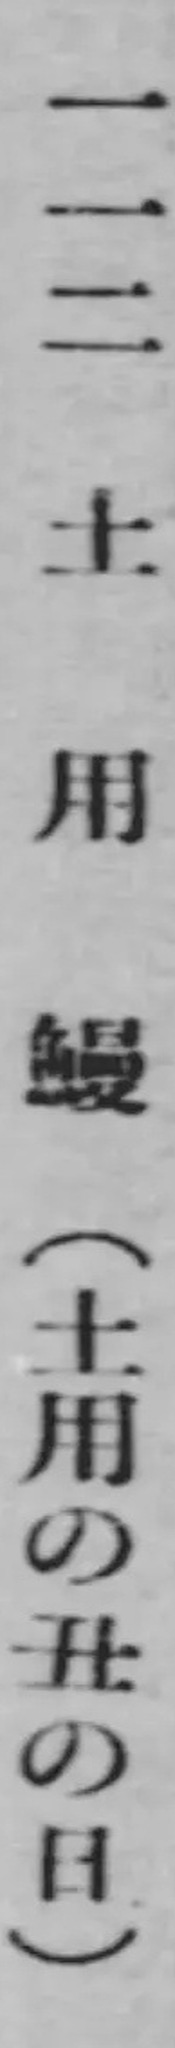一一二土用鰻(土用の丑の日)
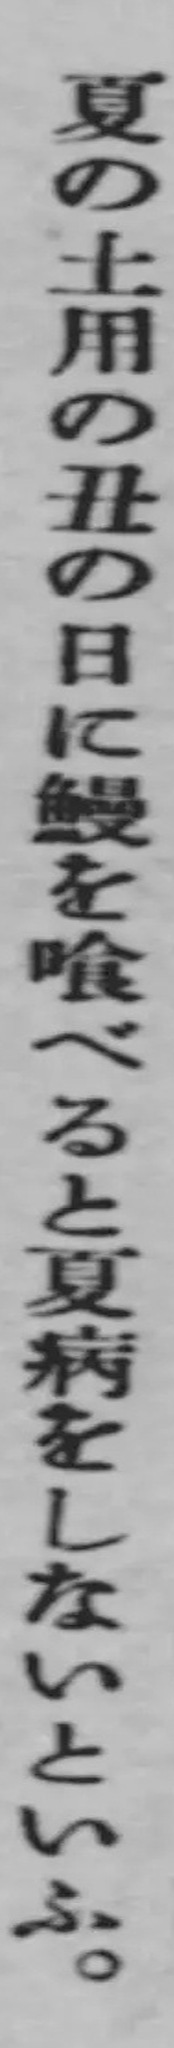夏の土用の丑の日に鰻を喰べると夏病をしないといふ。
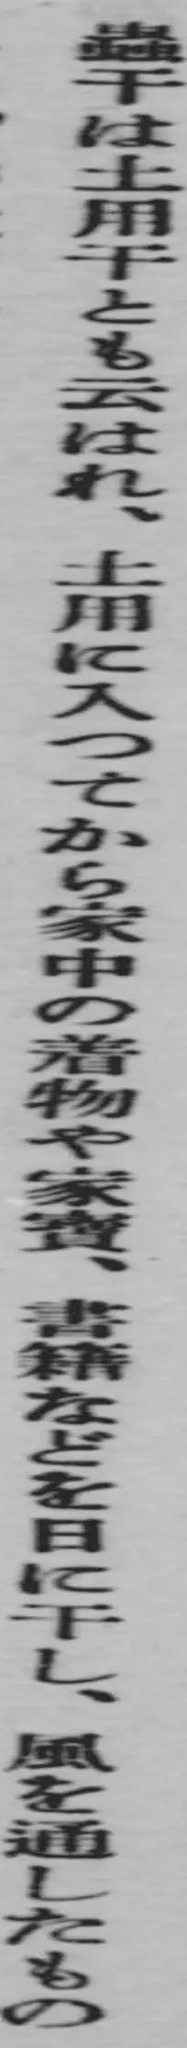蟲干は土用干とも云はれ、土用に入つてから家中の着物や家寶、書籍などを日に干し、風を通したもの
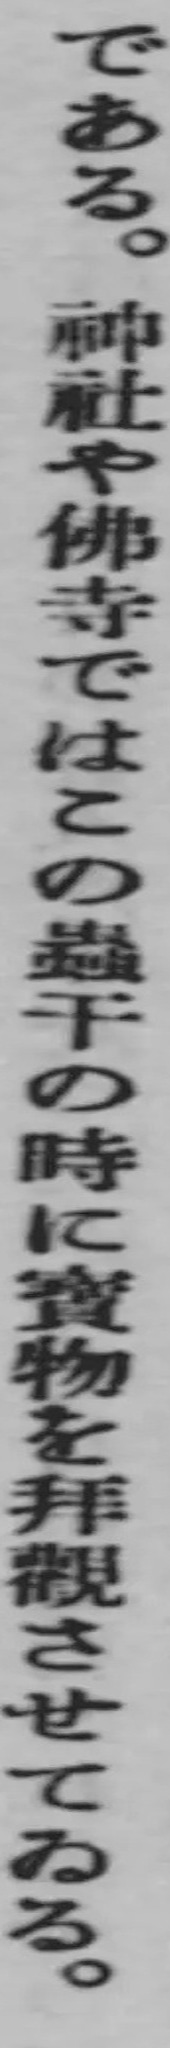である。神社や佛寺ではこの蟲干の時に寶物を拜觀させてゐる。
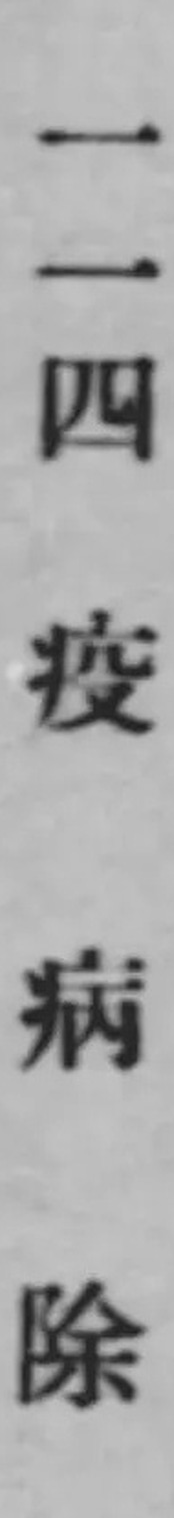一一四疫病除
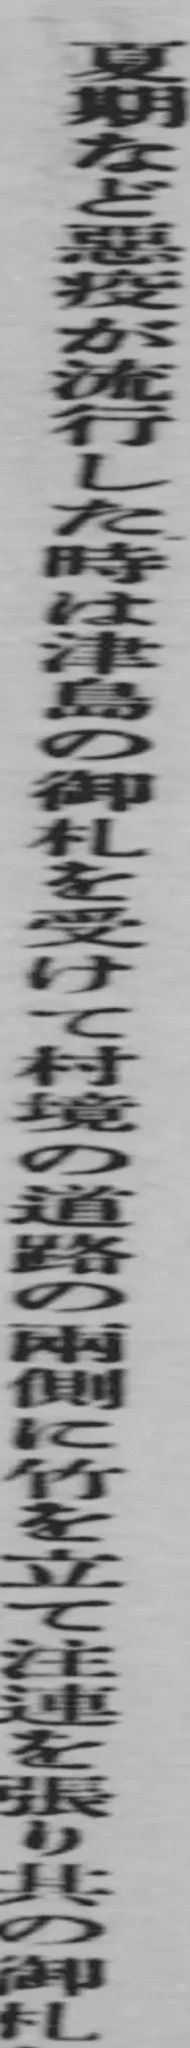夏期など惡疫が流行した時は津島の御札を受けて村境の道路の兩側に竹を立て注連を張り其の御札を
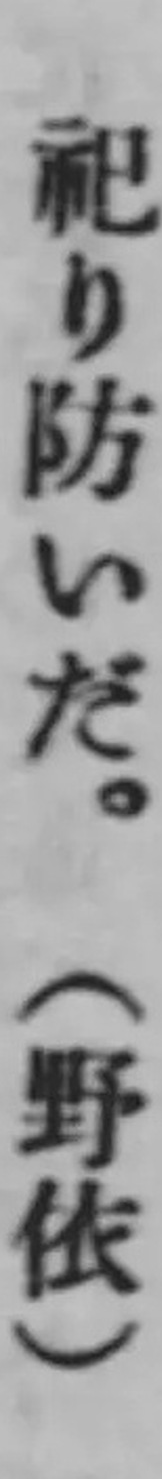祀り防いだ。(野依)
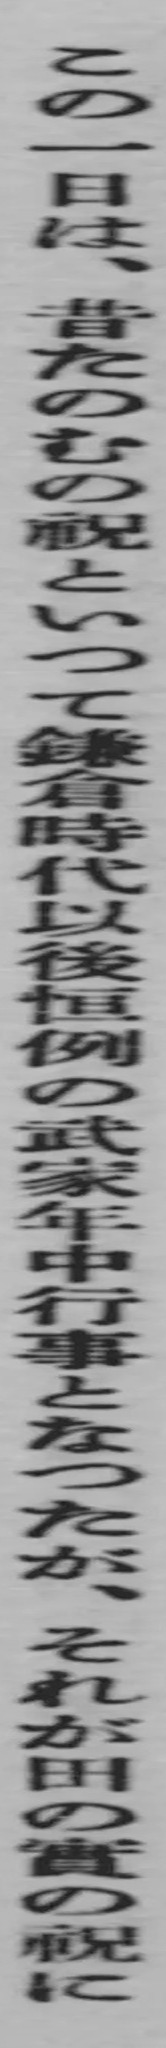この一日は、昔たのむの祝といつて鎌倉時代以後恒例の武家年中行事となつたが、それが田の實の祝に
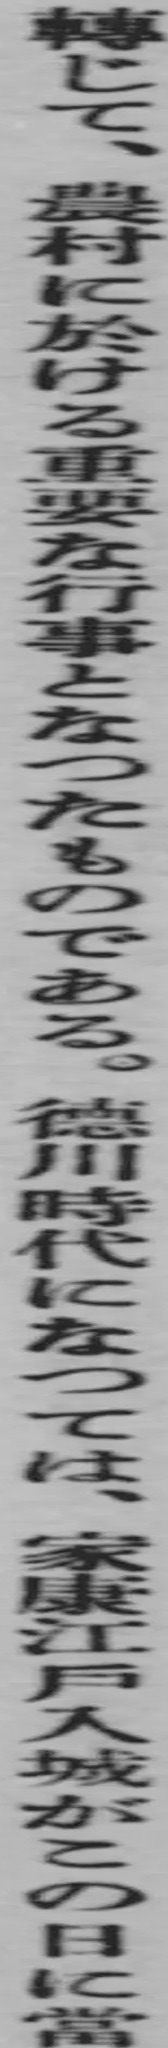轉じて、農村に於ける重要な行事となつたものである。德川時代になつては、家康江戸入城がこの日に當
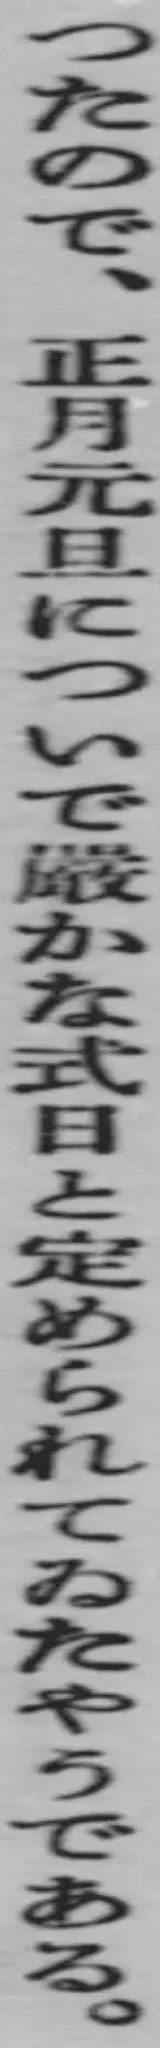つたので、正月元旦についで嚴かな式日と定められてゐたやうである。
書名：豊橋の年中行事
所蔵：国立国会図書館 National Diet Library, JAPAN
